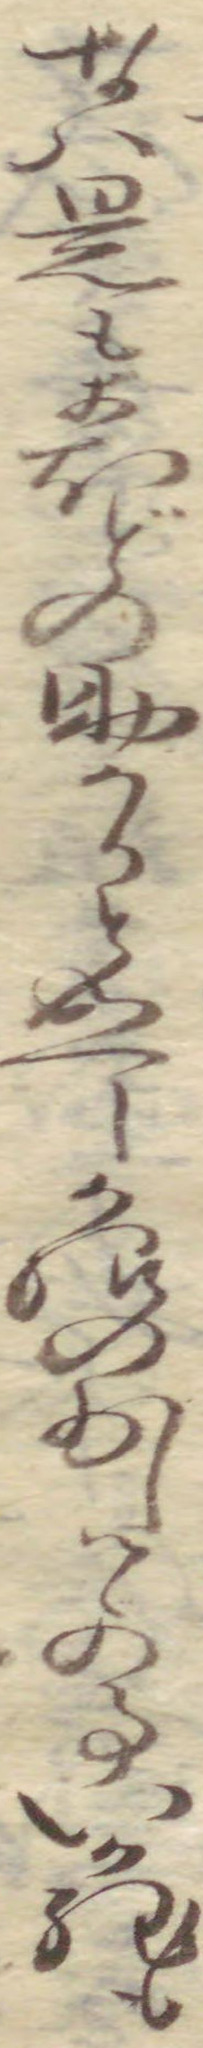なは是もよほどの助かりと成へしか様の少しツヽの事いか程も
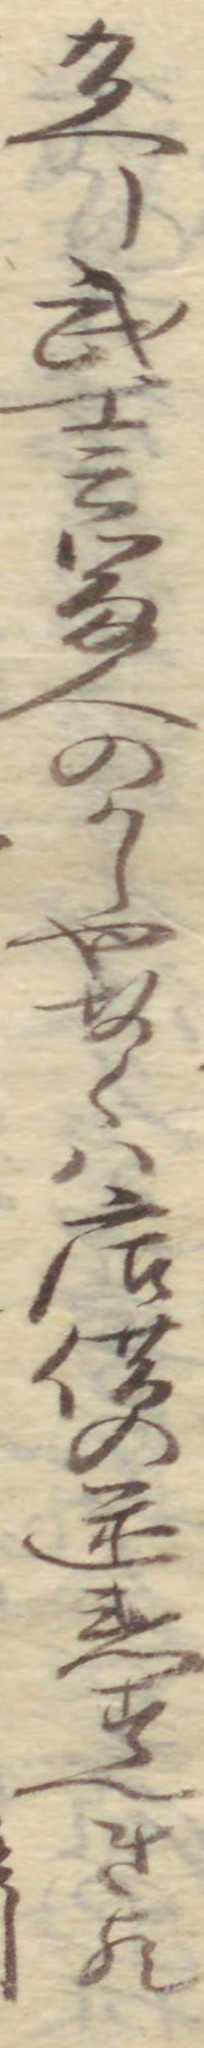有へし武士云富人のかしやなくは店借の迷惑すへき歟
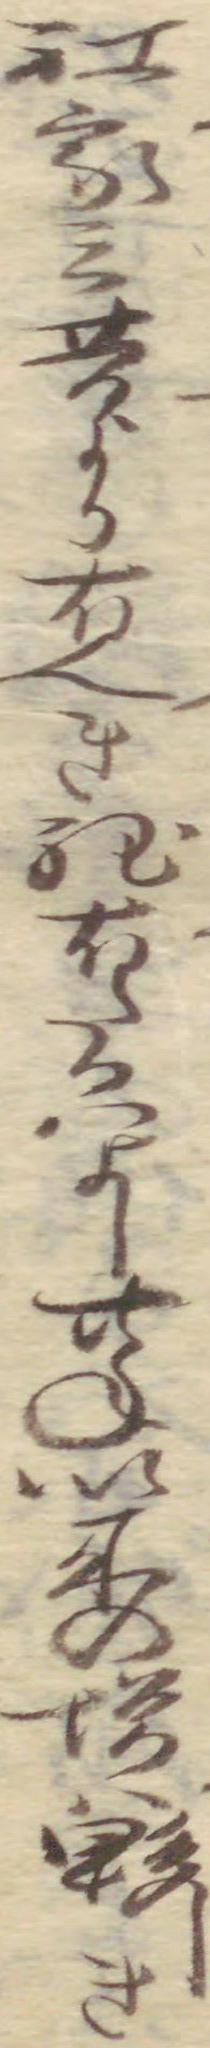社家云昔より有へき程有たるはよし廿年以来の増は夥しき
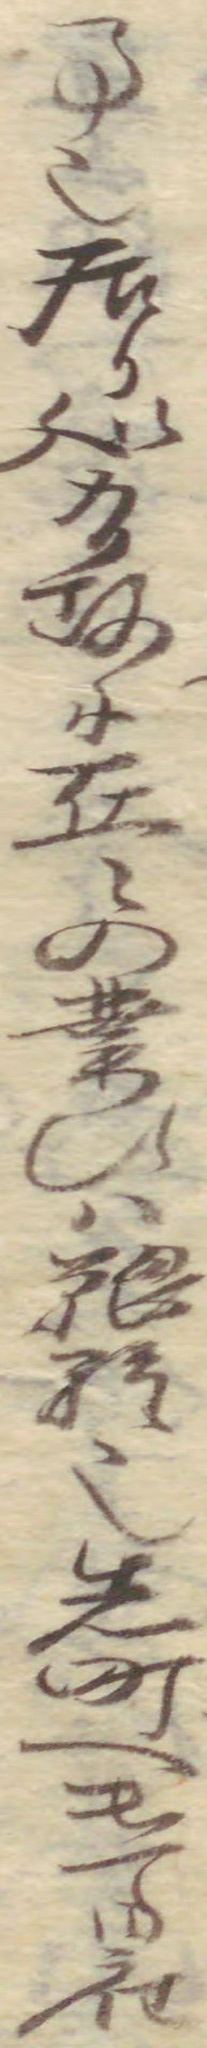事也居り処有故に在〻の業ひは艱難也先町へ出て日雇
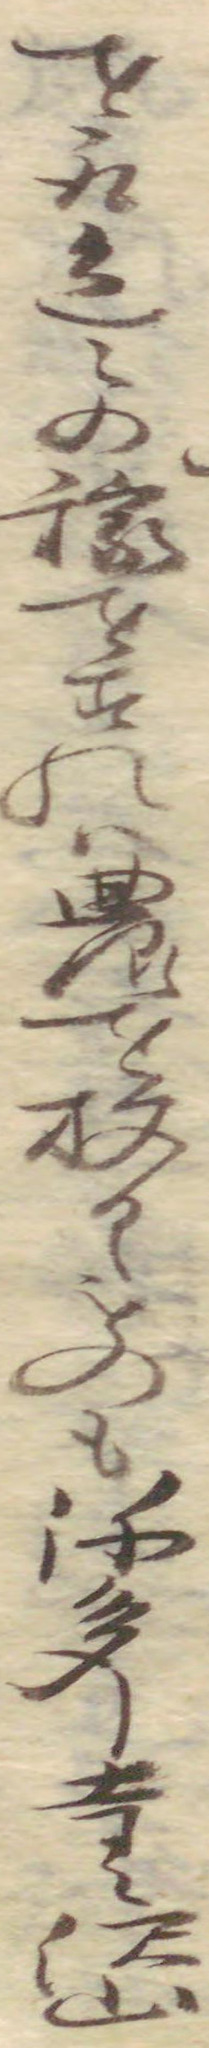を取色〻の稼をすれは農を放るゝものも弥多し寺〻沢山
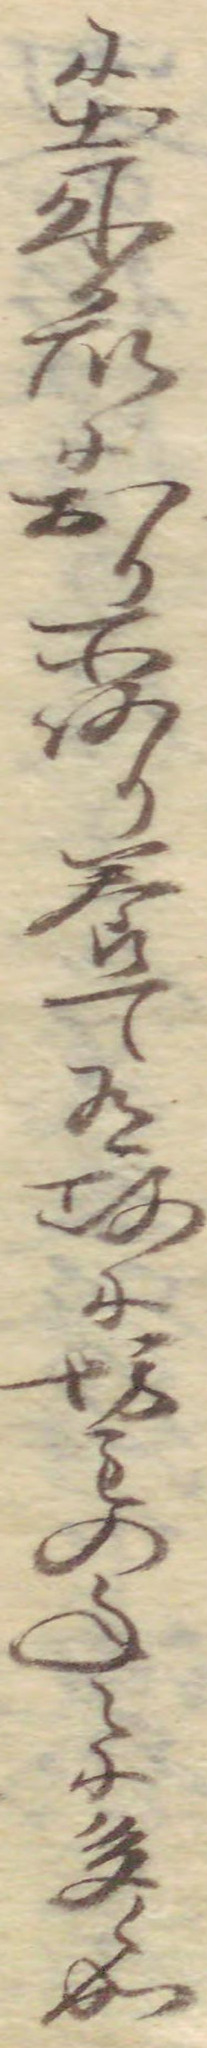に出来る故におり処あり養て有故に坊主の年〻に多く成
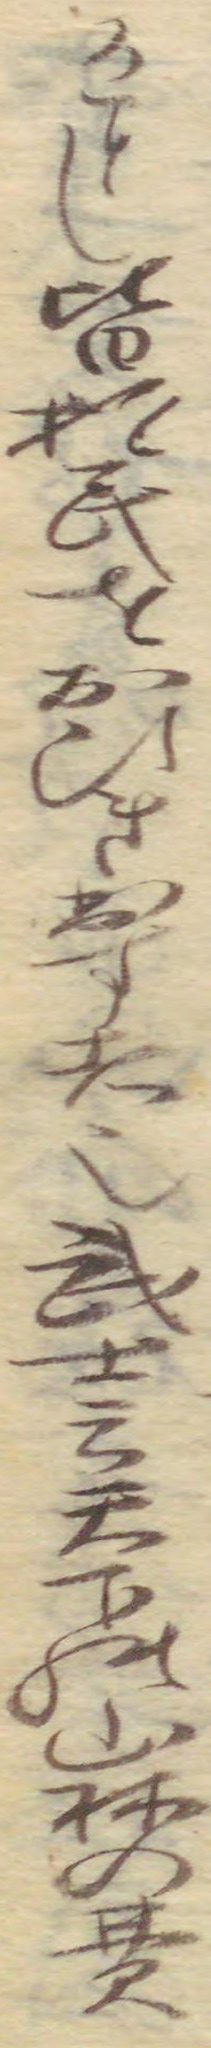ることし皆遊民をおひき出す者也武士云天下の山林の費

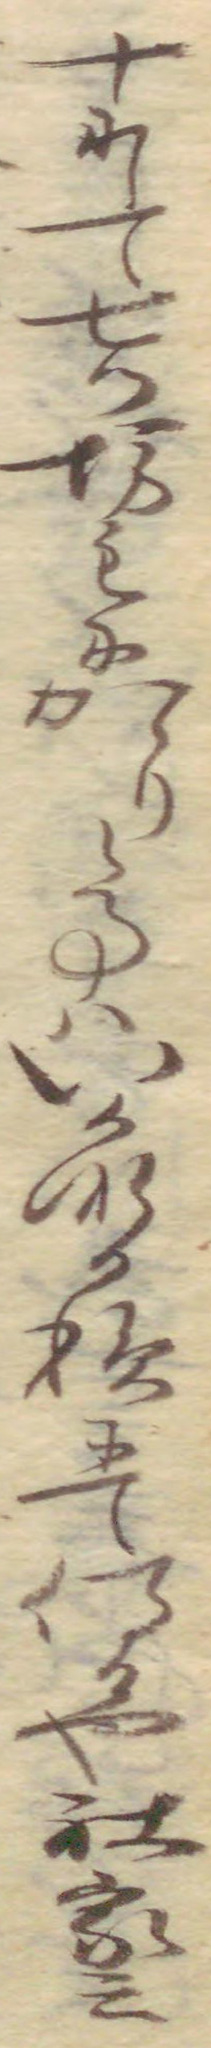十にて七ツ坊主にかゝり候事はいかなる積にて侍るや社家云
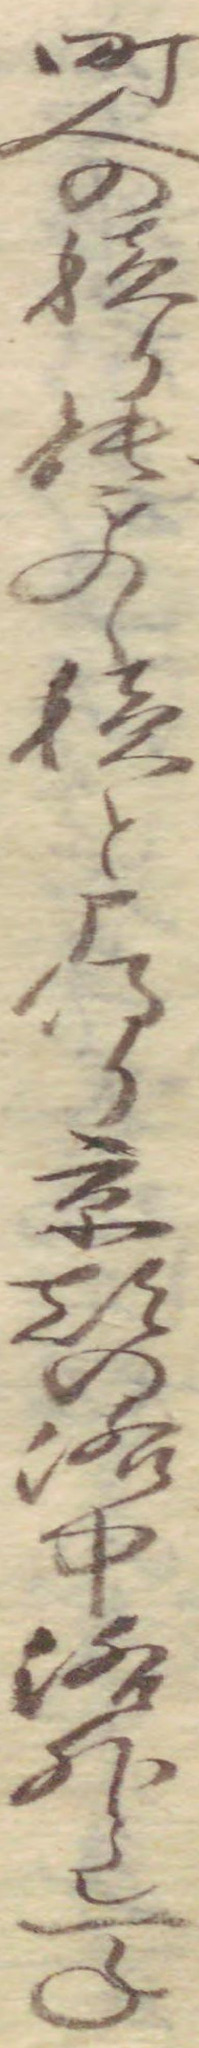町人の積り能ものゝ積と申侍り京都の洛中洛外ニて一年
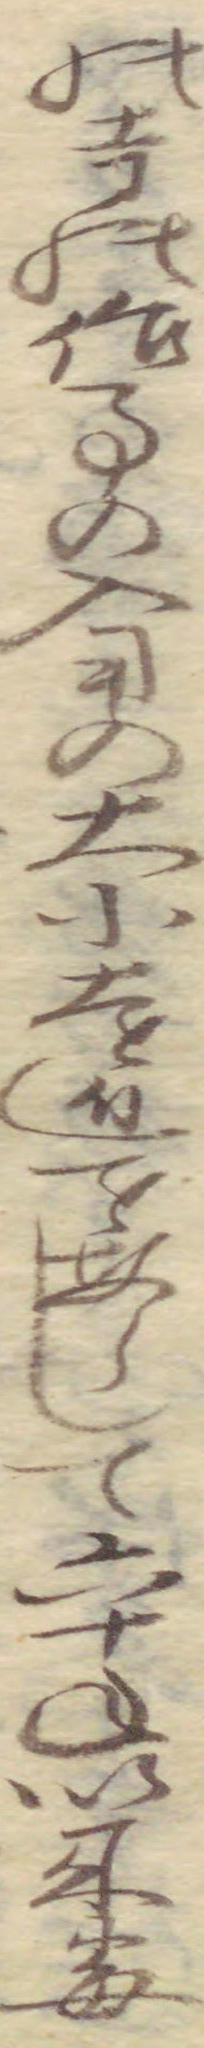の寺の作事の入用の大小遠近をならして六十年以来に毎
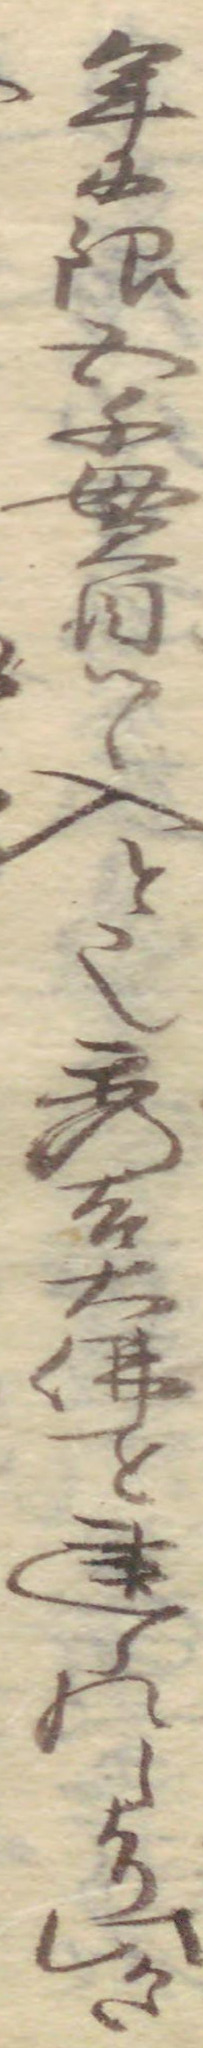年に銀五千貫目ツヽ入と也秀吉大仏を建られしより此かた
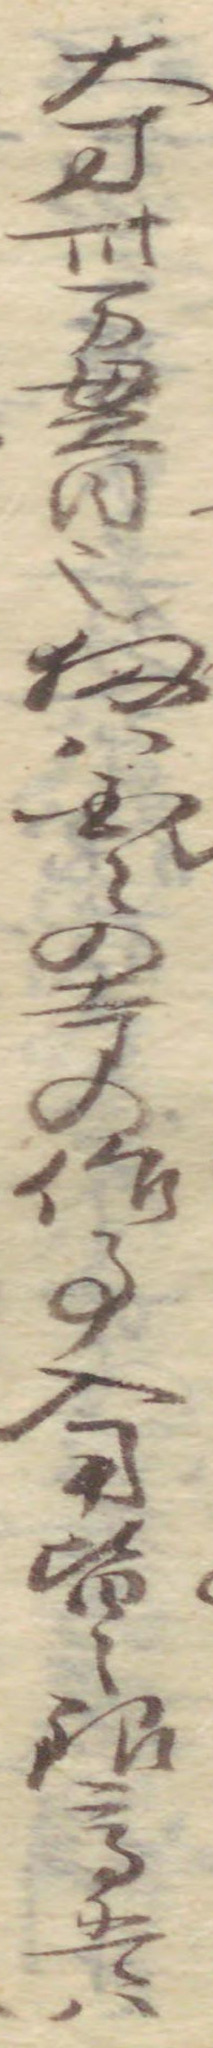大方卅万貫目也扨は国〻の寺の作事入用皆〻銀高にては
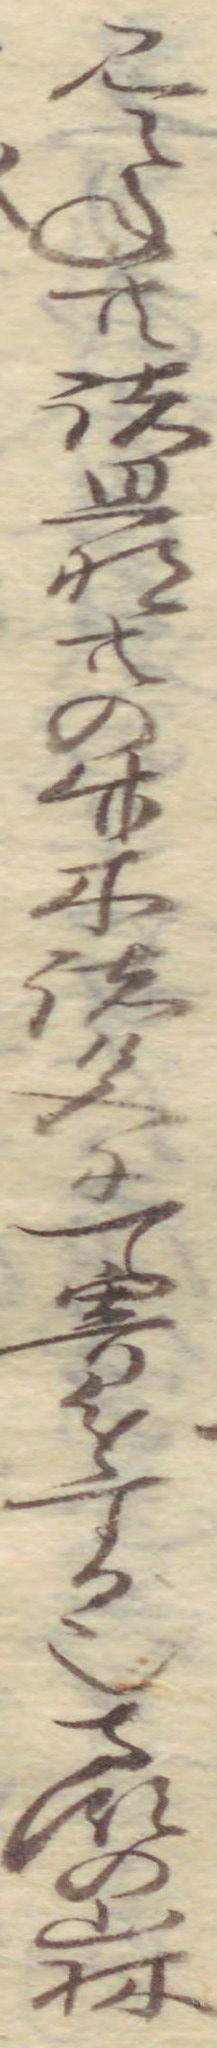見えね共諸旦那共の竹木諸色にて害をする也寺領の山林
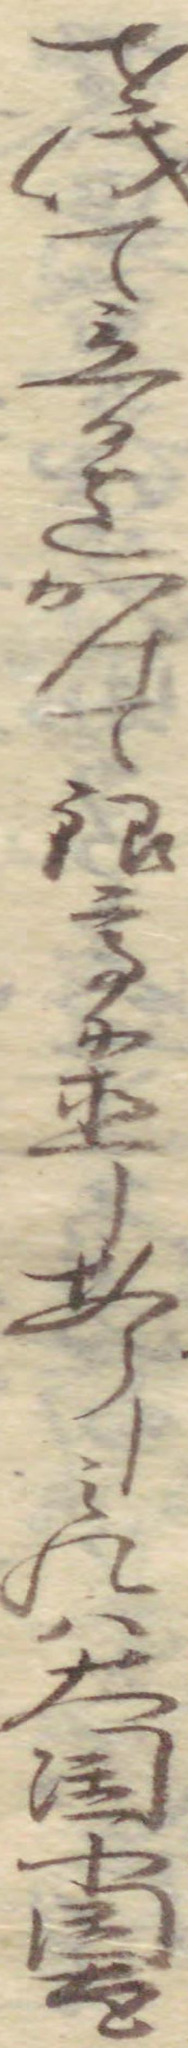を伐て立る迄かけて銀高に直しならしみれは大国小国遠
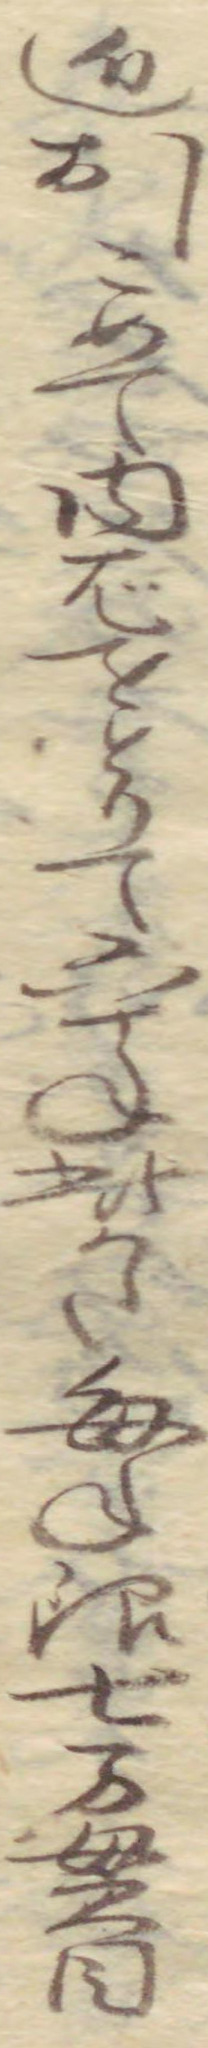近おしこめて内ばをとりて六十年此かた毎年銀七万貫目
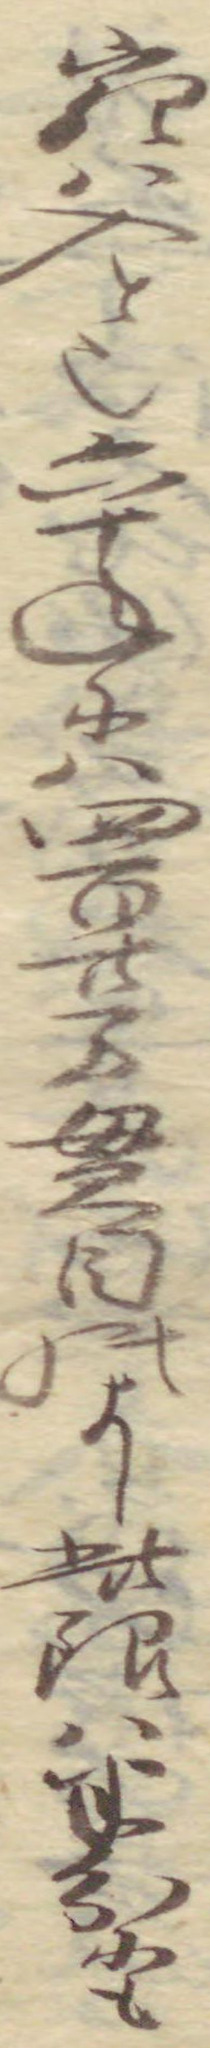宛は入と也六十年には四百廿万貫目のよし此銀は半分にも
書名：鶯宿雑記. 巻263-264
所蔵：国立国会図書館 National Diet Library, JAPAN
